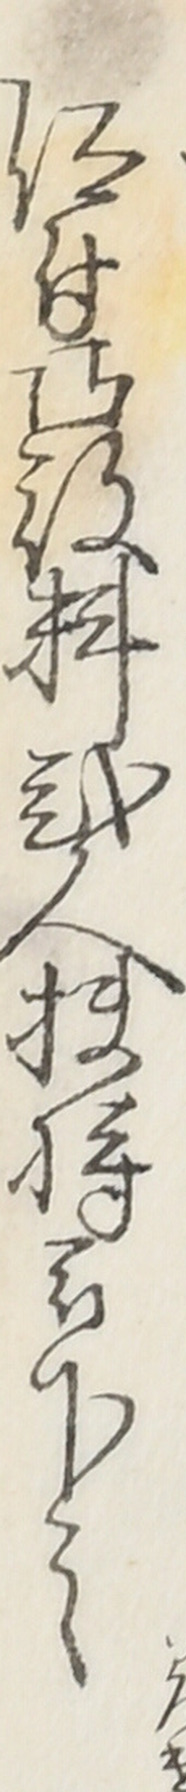仰付御役料弐人扶持被下之
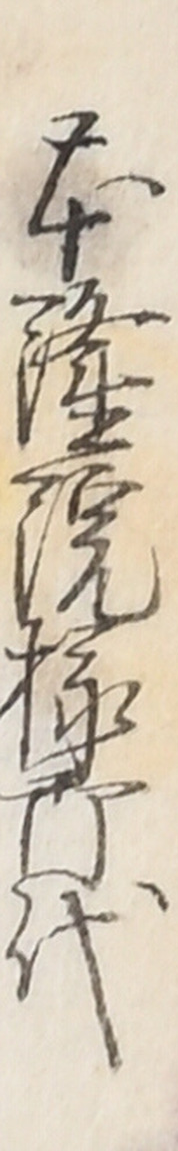本隆院様御代
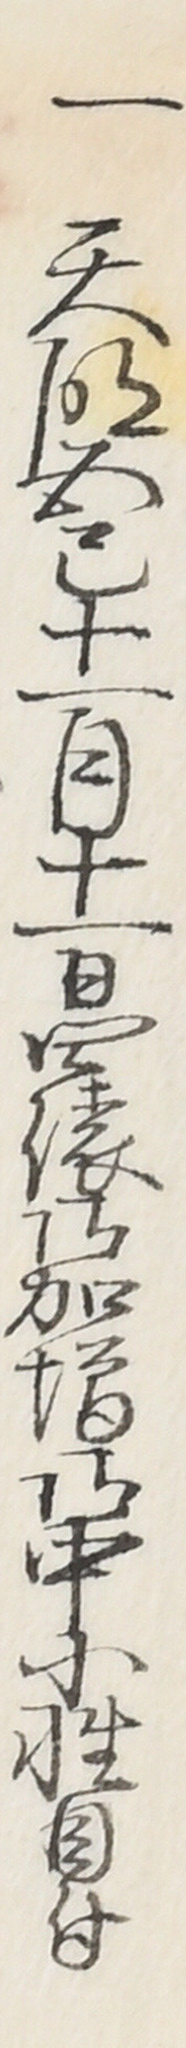一天明五巳十一月十一日四俵御加増御中小性目付
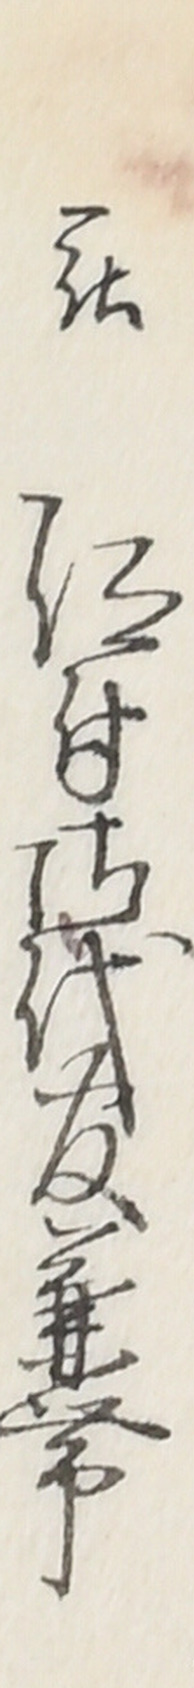被仰付御代官兼帯
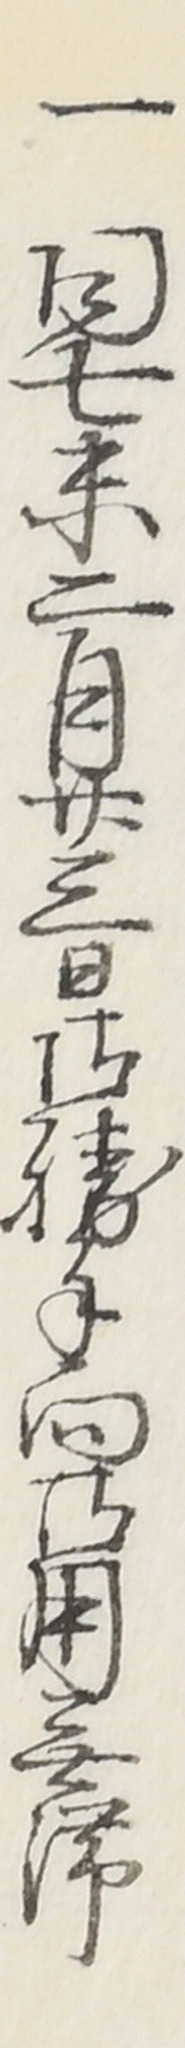一同七未二月廿三日御勝手向御用無滞
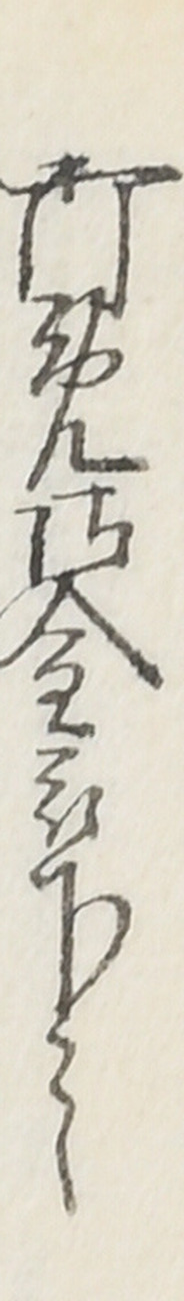御免御金被下之
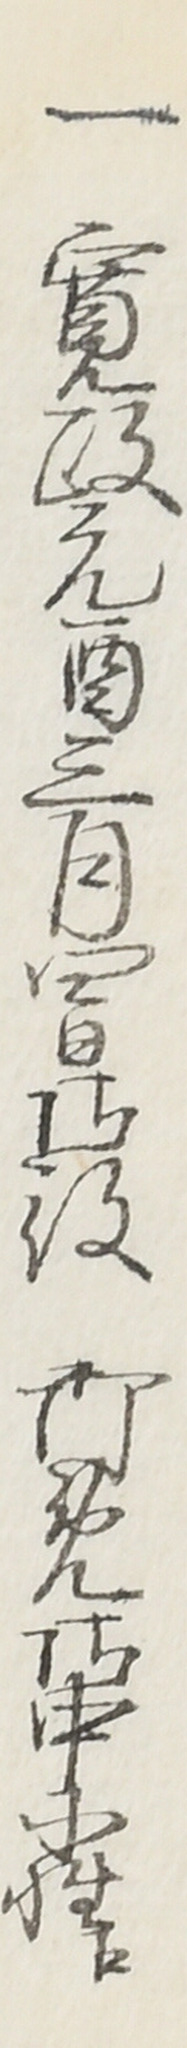一寛政元酉三月四日御役御免御中小性江
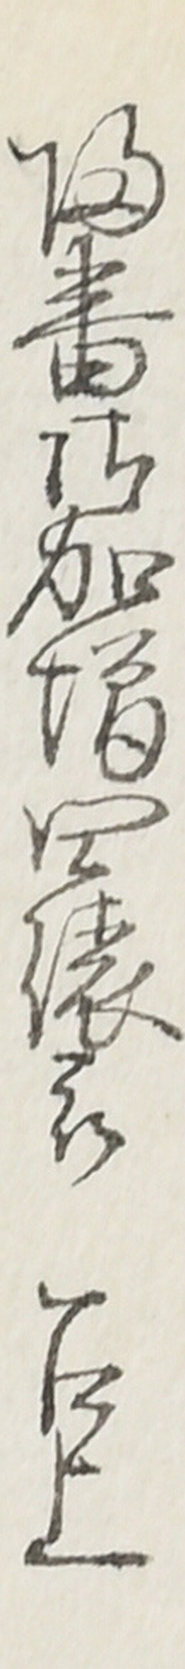帰番御加増四俵被召上
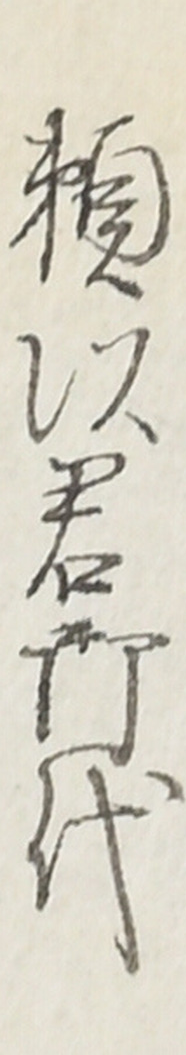頼以君御代
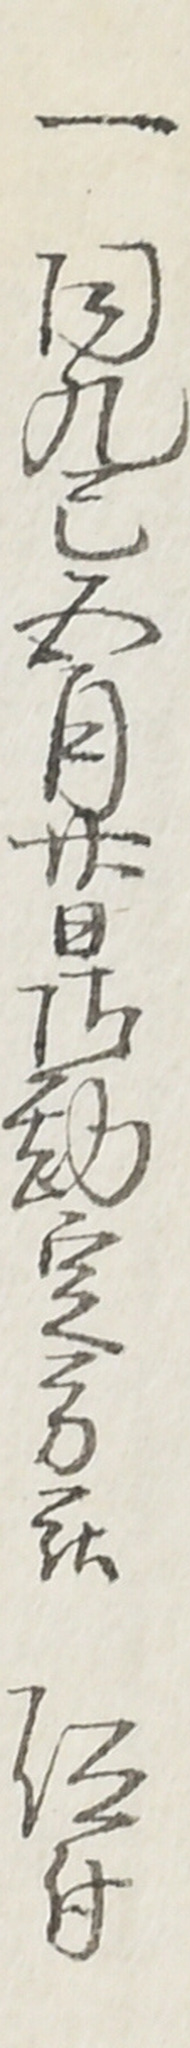一同九巳五月廿日御勘定方被仰付
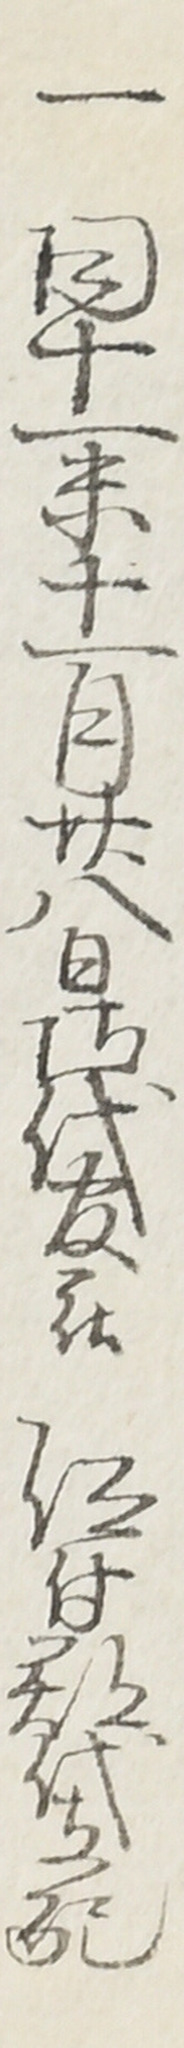一同十一未十一月廿八日御代官被仰付郡代支配
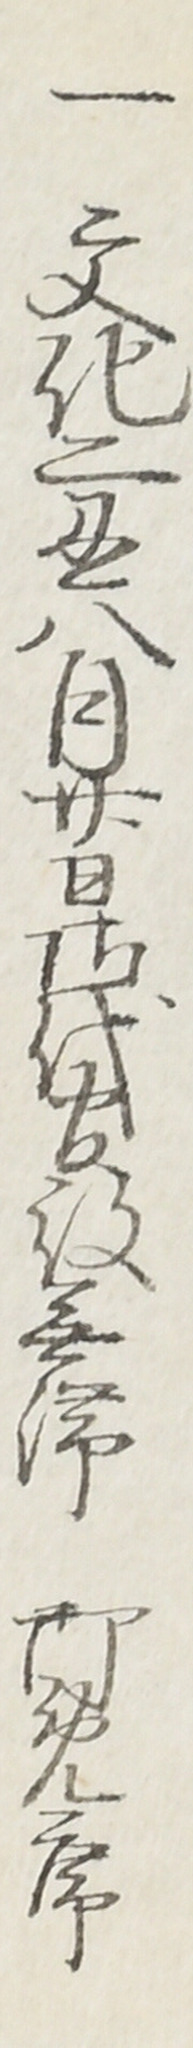一文化二丑八月廿日御代官役無滞御免席
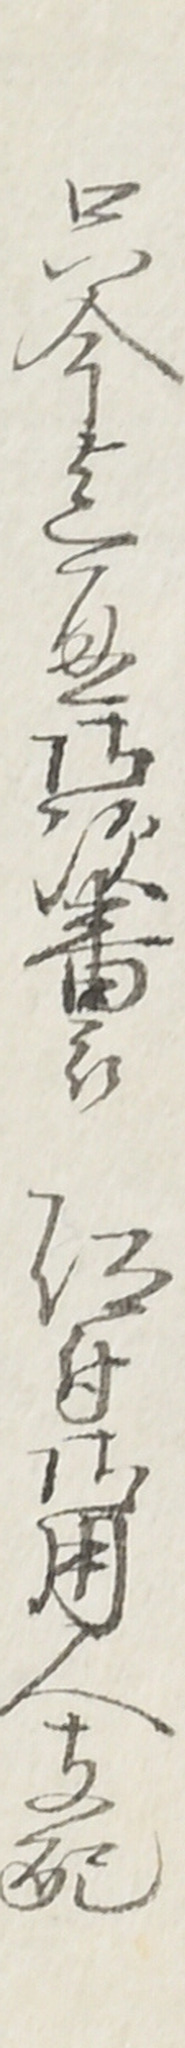只今迄通御次番被仰付御用人支配
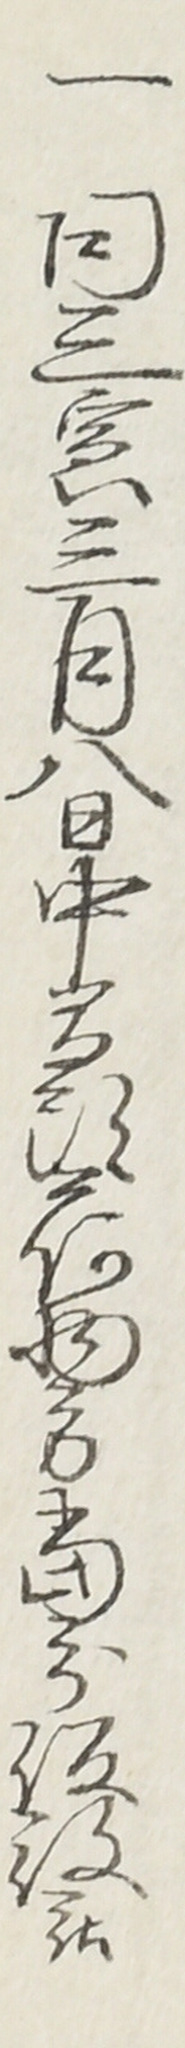一同三寅三月八日中間頭荷物方当分仮役被
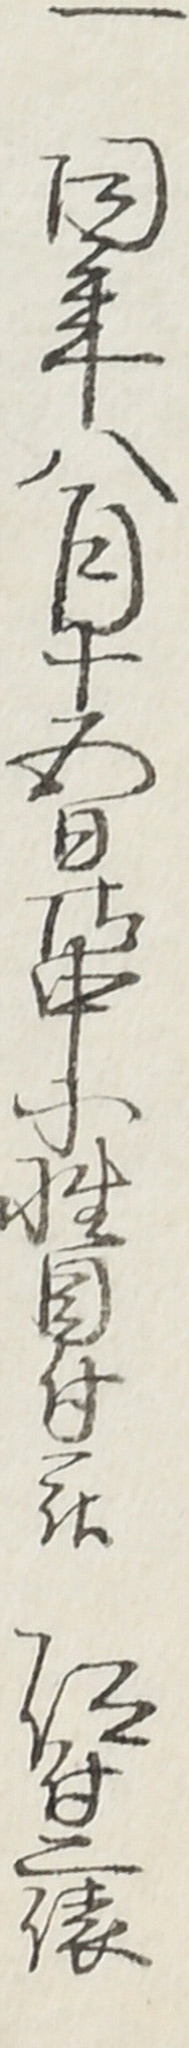一同年八月十五日御中小性目付被仰付二俵
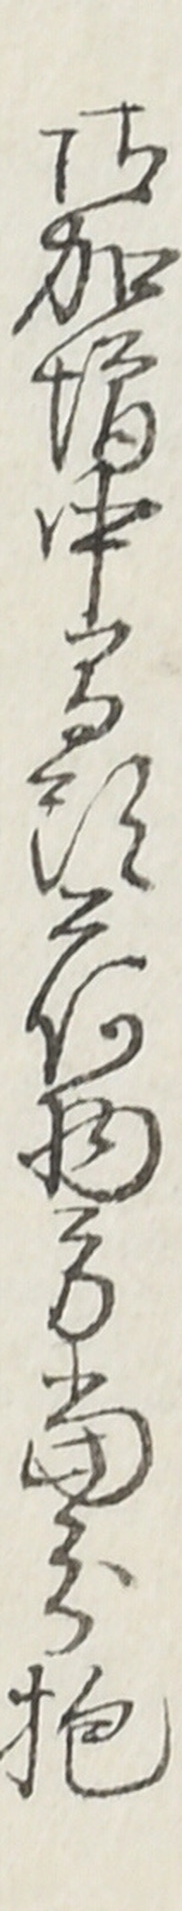御加増中間頭荷物方当分抱
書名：給人諸士勤仕録（七）
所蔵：伊那市立高遠町図書館・合同会社AMANE
